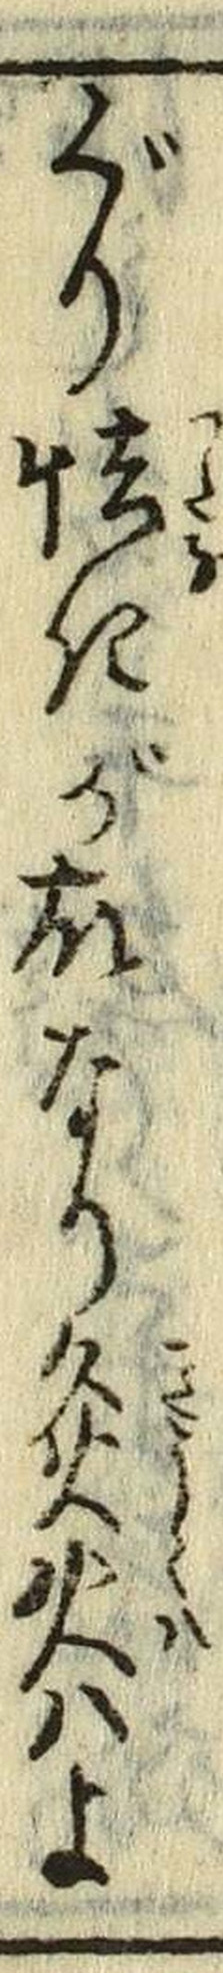ぐり拙きが故なり灸火はよ
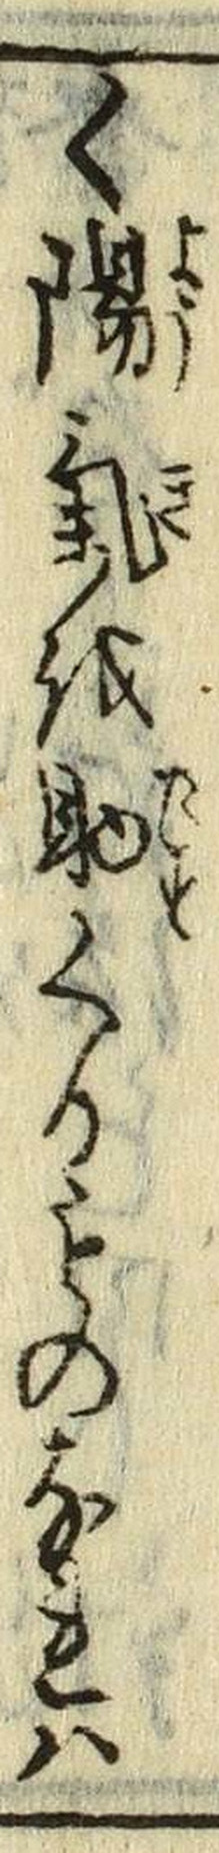く陽気を助くるものなれは
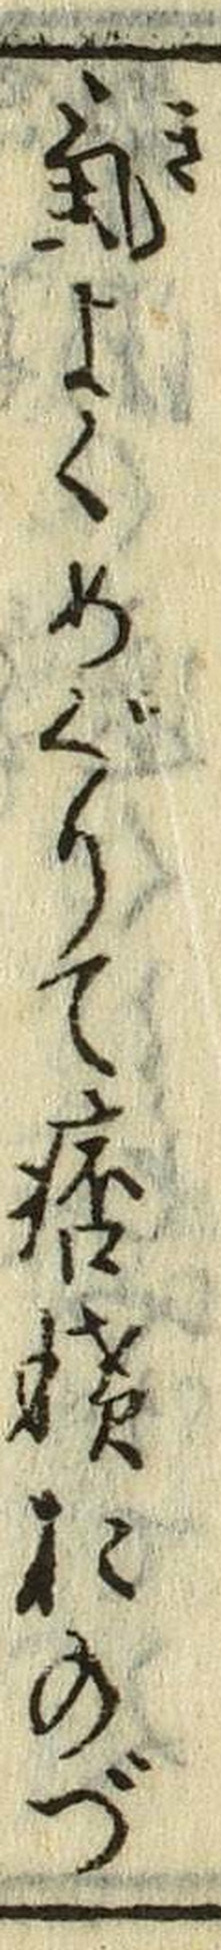気よくめぐりて痞積おのづ
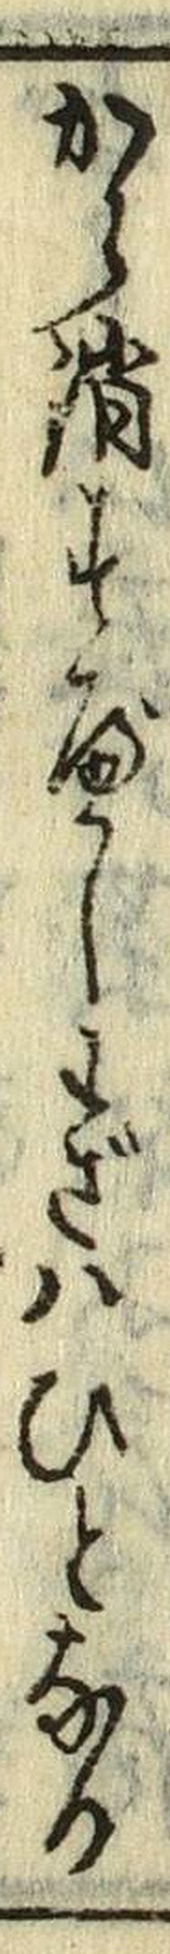から消すべしわざはひとなる
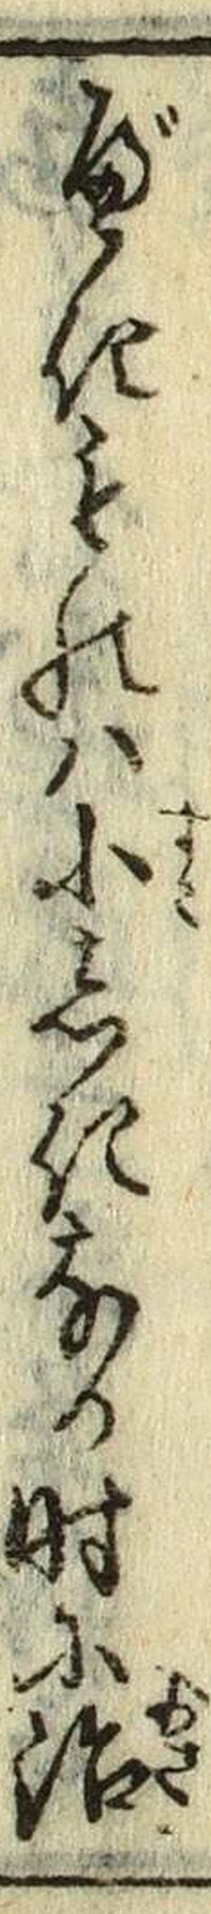べきものは小しきなる時に治
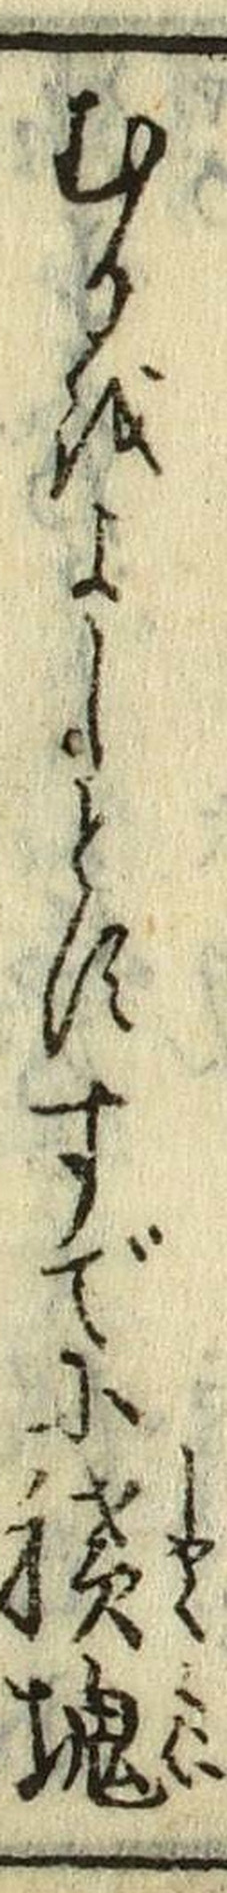むるをよしとすすでに積塊
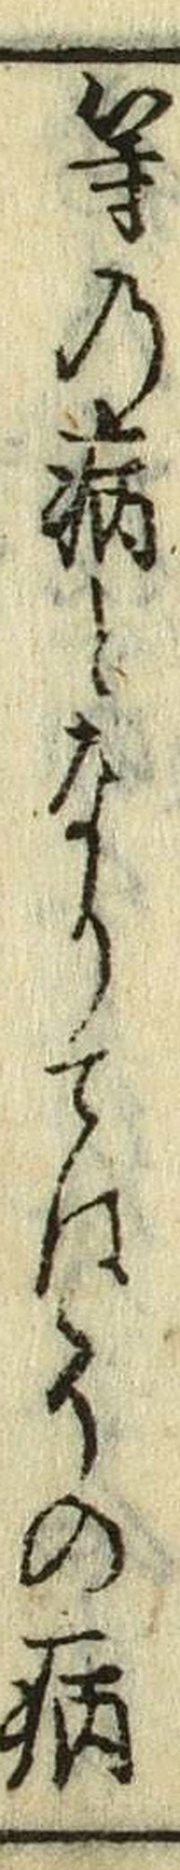等の病となりてはその病
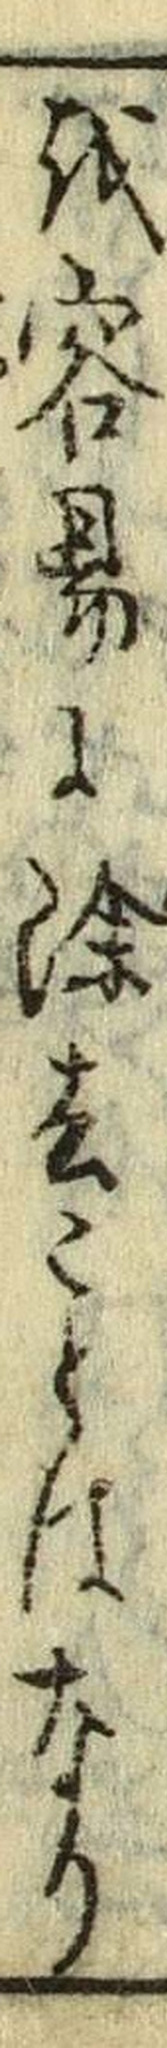を容易に除去ことはなり

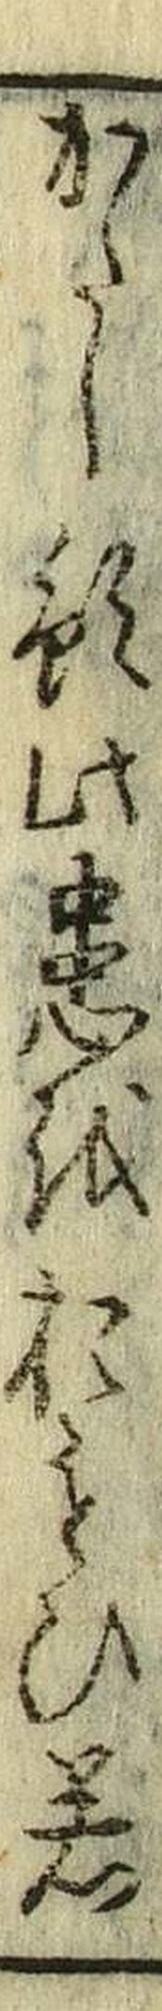がたし預此患をおもひ若
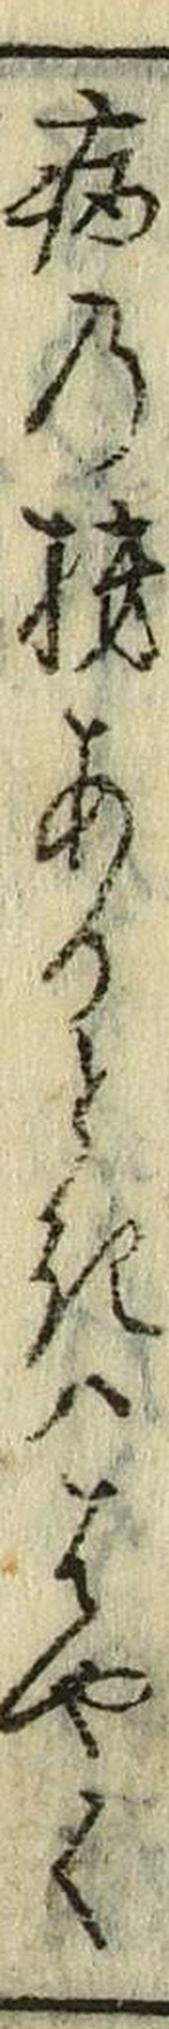病の機あるときははやく
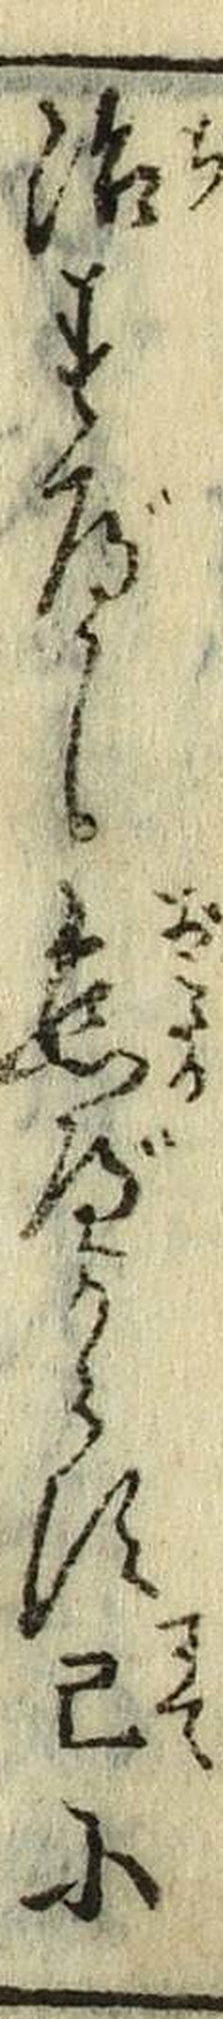治すべし怠べからす已に
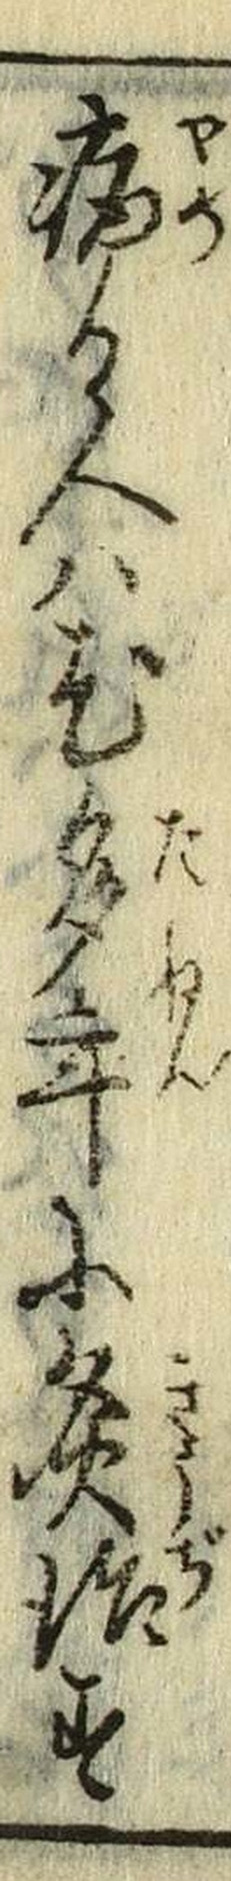病る人は尤多年に灸治す
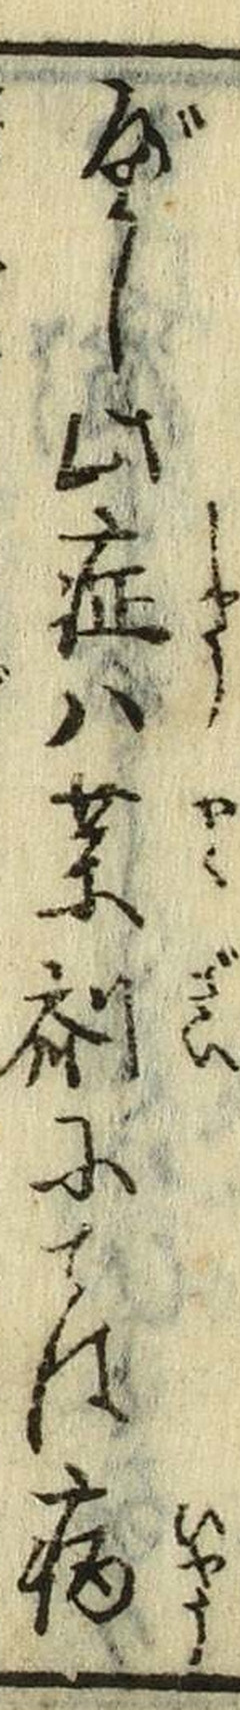べし此症は薬剤にては病
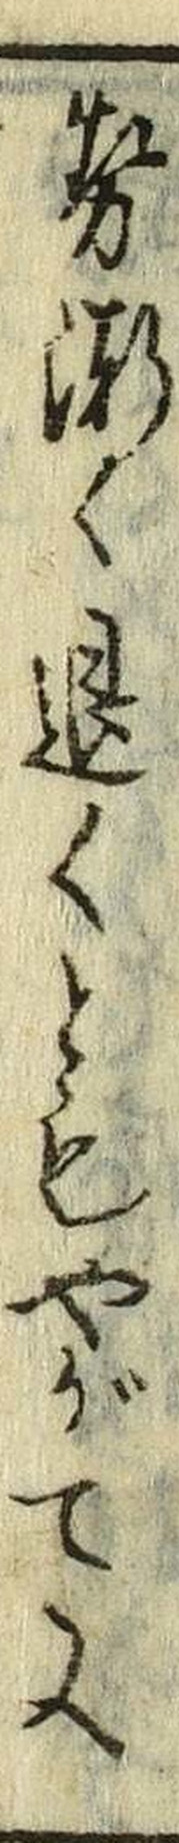勢漸く退くともやがて又
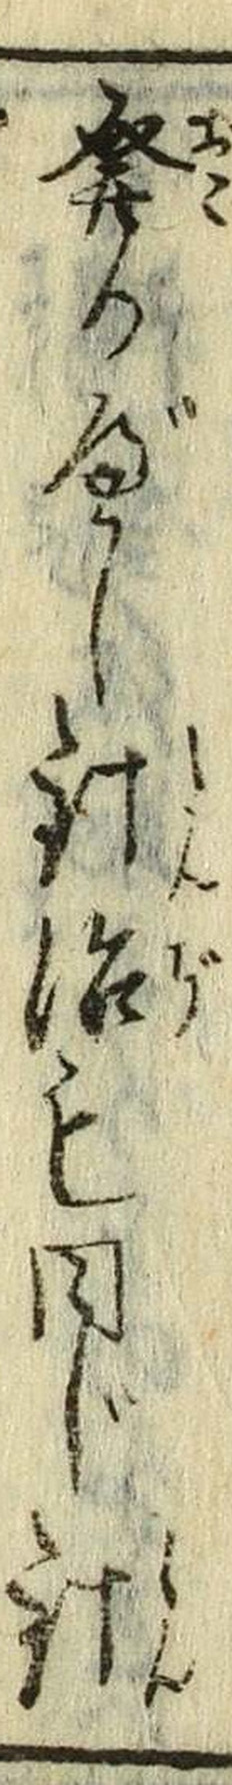発るべし針治も同じ針
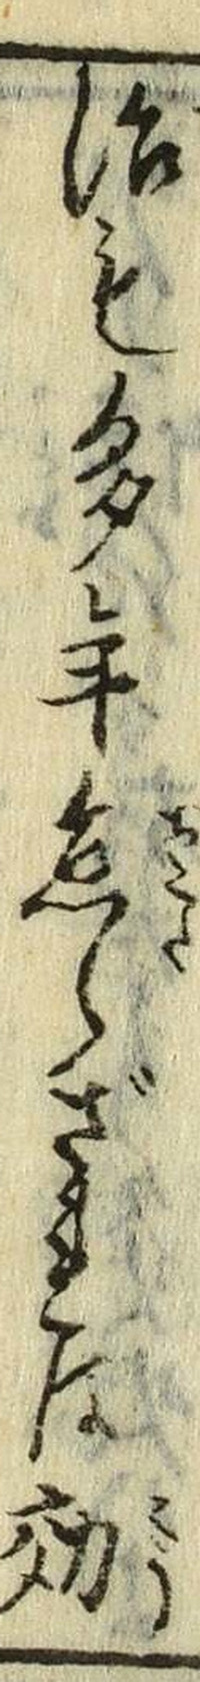治も多年怠らざれは効
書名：居家養生記
